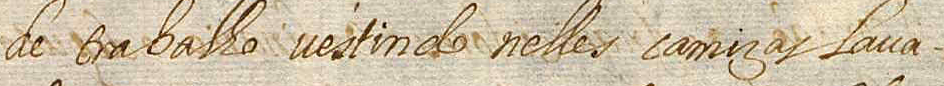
de trabalho uestindo nelles camizas laua
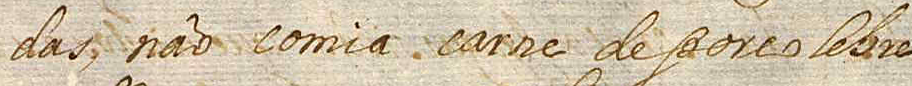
das, não comia carne de porco lebre
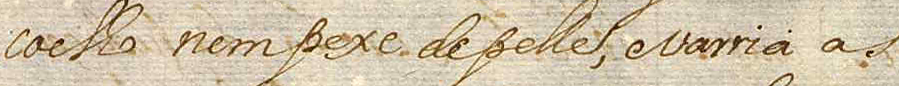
coelho nem pexe de pelle, e varria as
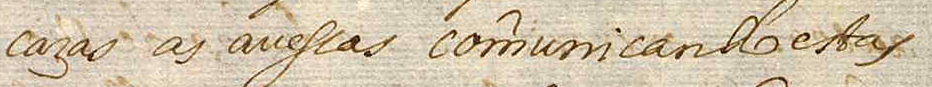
cazas as auessas com̄unicando estas
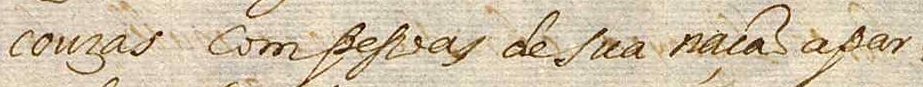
couzas com pessoas de sua nação apar
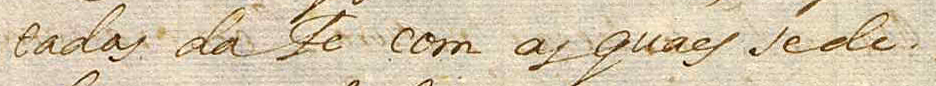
tadas da Fe com as quaes se de
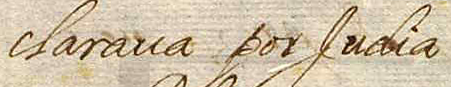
claraua por Judia
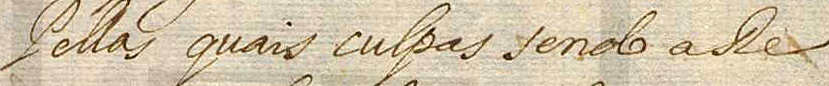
Pellas quais culpas sendo a Re
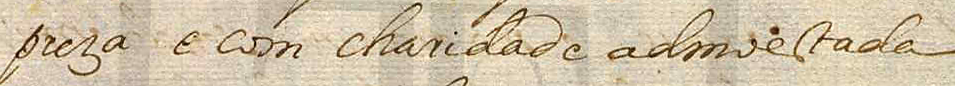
preza e com charidade admoestada
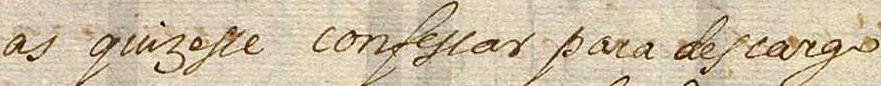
as quizesse confessar para descargo
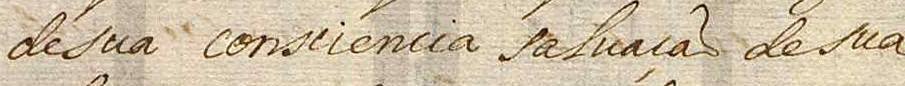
de sua consciencia saluação de sua
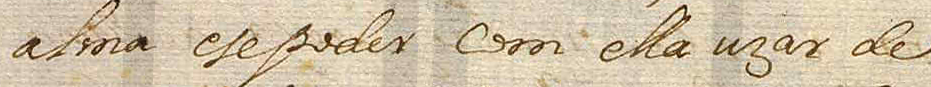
alma e se poder com ella uzar de
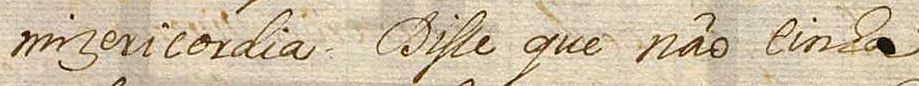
mizericordia Disse que não tinha
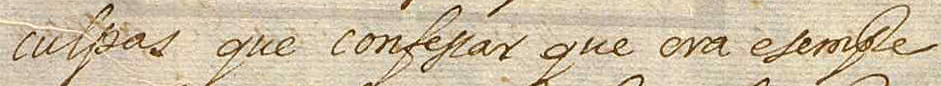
culpas que confessar que era e sempre
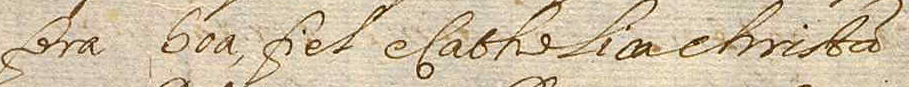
fora boa, fiel e Catholica christã
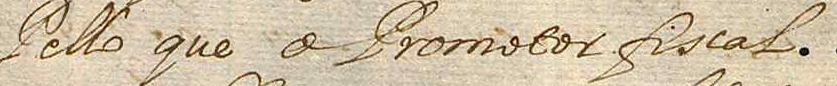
Pello que o Promotor fiscal
